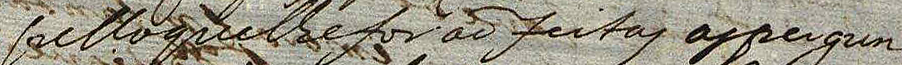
pello que lhe foraõ feitas as pergun
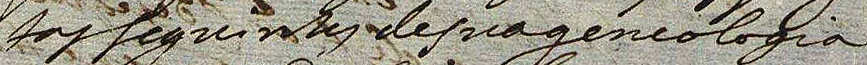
tas seguintes de sua geneologia
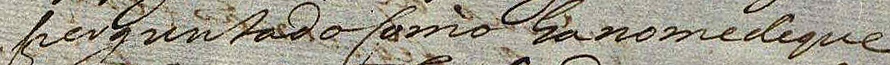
perguntado Como ha nome de que
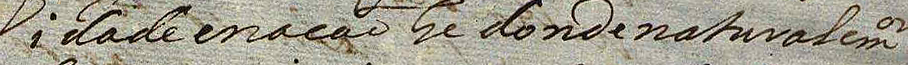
idade e nacaõ he donde natural e mor
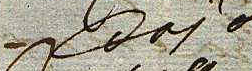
das
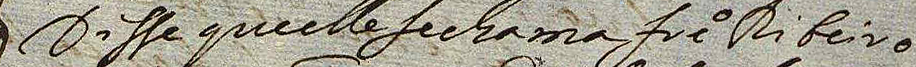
Disse que elle se chama frco Ribeiro
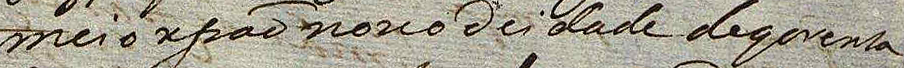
meio xpaõ nouo de idade de qorenta
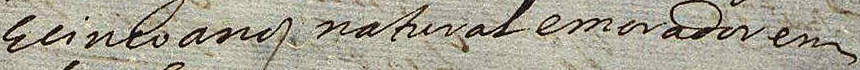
E cinco anos natural e morador em
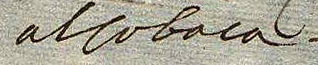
alCobaca
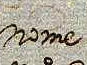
nome
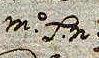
m.o x. n.
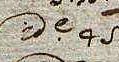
id.e 45.
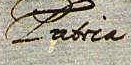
Patria
